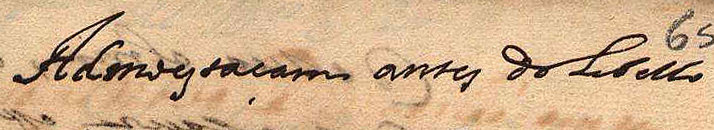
Admoestaçam antes do Libello
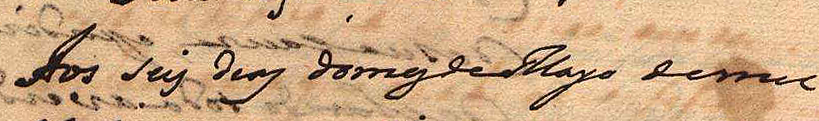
Aos seis dias do mes de Mayo de mil
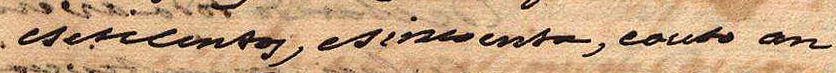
e setecentos, e sincoenta, e outo an
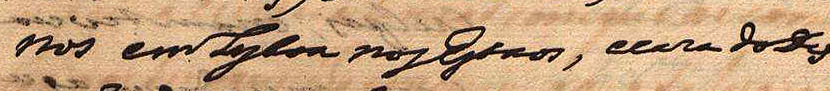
nos em Lisboa nos Estaos, e caza do Des
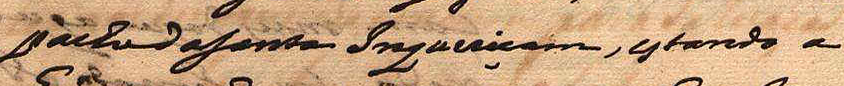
pacho da santa Inquiziçam, estando a
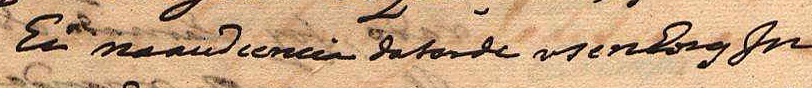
hi na audiencia da tarde o senhores Jn
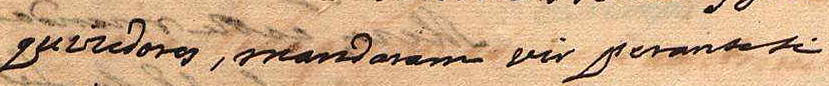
quizidores, mandaram vir perante si
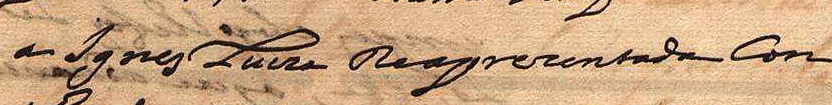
a Ignes Luiza, Re aprezentada con
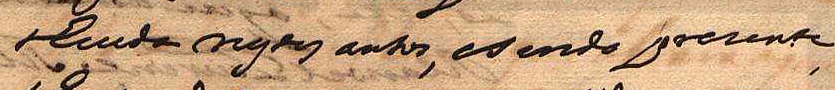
theuda nestes autos, e sendo prezente
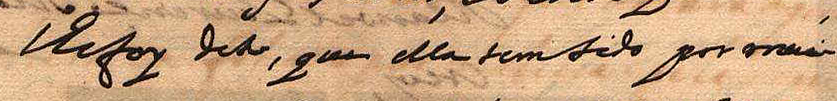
lhe foy dito, que ella tem sido por mui
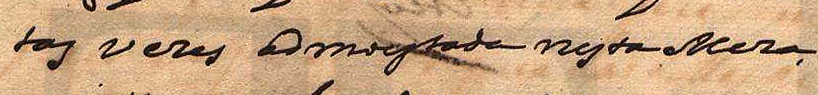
tas vezes admoestada nesta Meza,
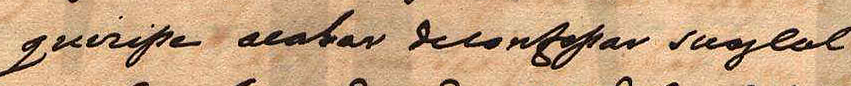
quizisse acabar de confessar suas cul
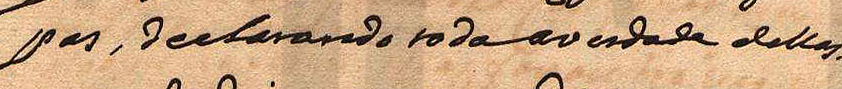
pas, declarando toda a verdade dellas,
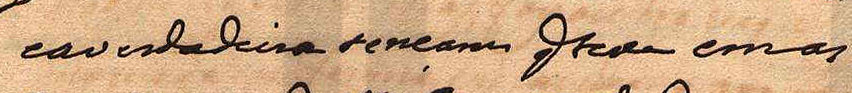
e a verdadeira tençam q̄ teve em as
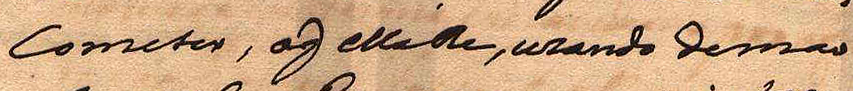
Cometer, o q̄ ella Re, uzando de mao
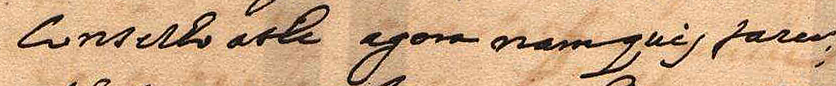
Conselho athe agora nam quis fazer;
